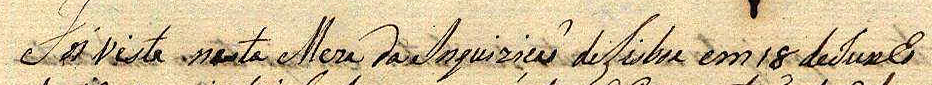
Foi vista nesta Meza da Inquiziçaõ de Lisboa em 18 de Iunho
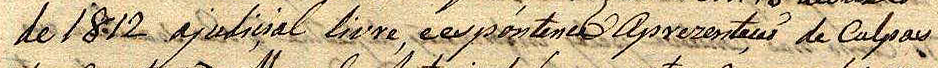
de 1812 a judiçial livre, e espontenea aprezentaçaõ de culpas
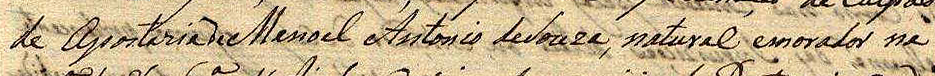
de Apostazia de Manoel Antonio de Souza, natural e morador na
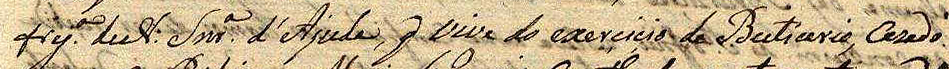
freg.a de N. Snr.a d'Ajuda, q̄ vive do exercicio de Buticario, Cazado
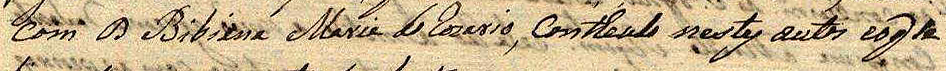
com D Bibiena Maria do Rozario, Contheudo nestes autos e o q̄ se
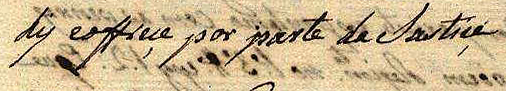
dis e offrece por parte da Iustiça
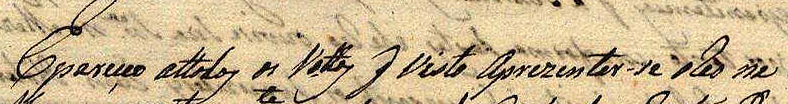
E pareceo a ttodos os Vottos q̄ visto Aprezentar-se o Reo na
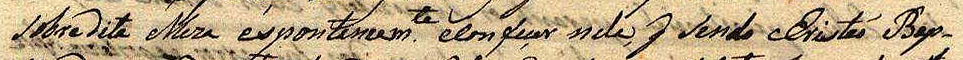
sobredita Meza esponteneam.te e confeçar nele, q̄ sendo christaõ Bap
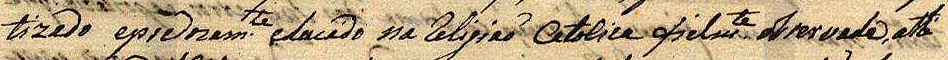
tizado e piedozam.te educado na Religiaõ Catolica fielm.te observada, athé
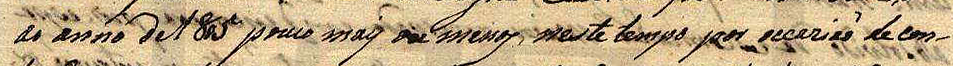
ao anno de 1805 pouco mais ou menos, neste tempo por occaziaõ de con
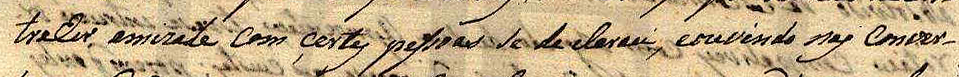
trahir amizade com certas pessoas se declarou, e ouvindo nas conver
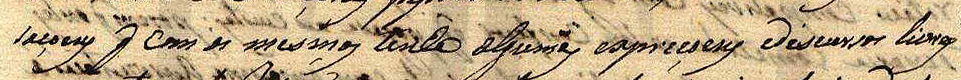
saçoens q̄ com os mesmos tinha algumas expreçoens e discursos livres
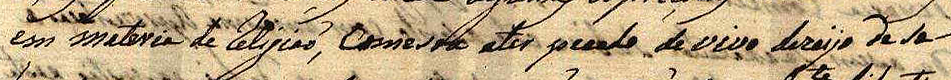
em materia de Religiaõ, comesou a ter pecado de vivo dezaijo de sa
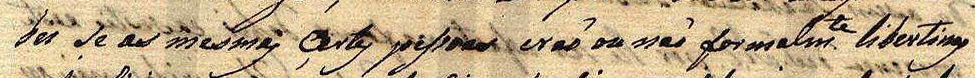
ber se as mesmas certas pessoas eraõ ou naõ formalm.te libertinas
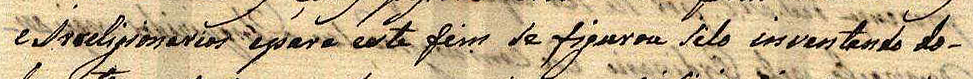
e Irreligionarios e para este fim se figurou selo inventando do
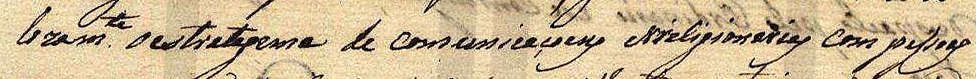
lozam.te o estratagema de comunicaçoens Irreligionarias com pessoas
